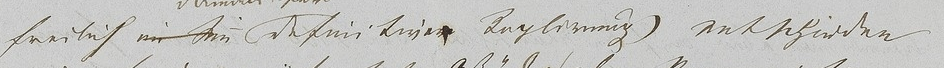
(freilich im Sinndamals für definitive Reglirung) entschieden
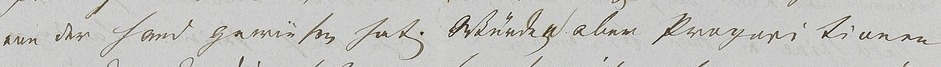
von der Hand gewiesen hat. Würden aber Propositionen
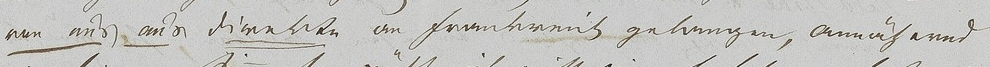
von uns aus direkte an Frankreich gelangen, annähernd
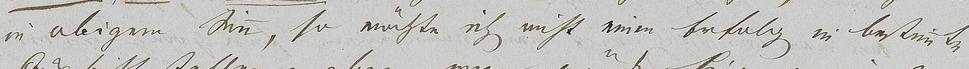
in obigem Sinn, so möchte ich nicht einen Erfolg in bestimmte
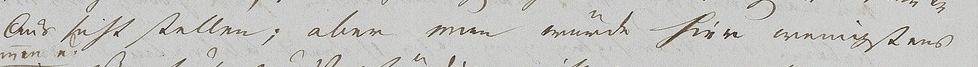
Aussicht stellen; aber man würde hier wenigstens
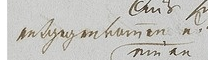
entgegenkommen u.
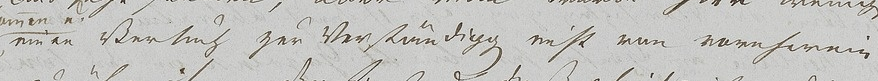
einen Versuch zur Verständigg nicht von vornherein
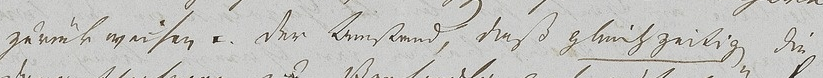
zurükweisen. Der Umstand, daß gleichzeitig die
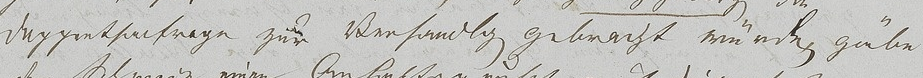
Dappenthalfrage zur Verhandlg gebracht würde, gäbe
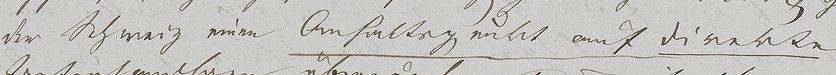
der Schweiz einen Anhaltspunkt auf direkte
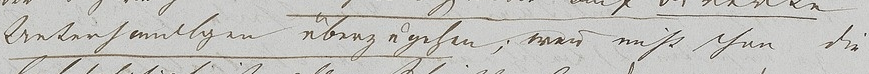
Unterhandlgen überzugehen; wenn nicht schon die
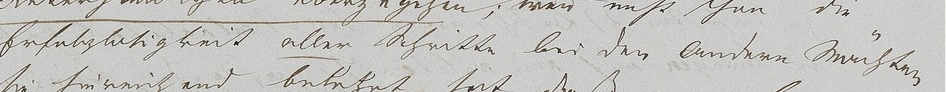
Erfolglosigkeit aller Schritte bei den andern Mächten
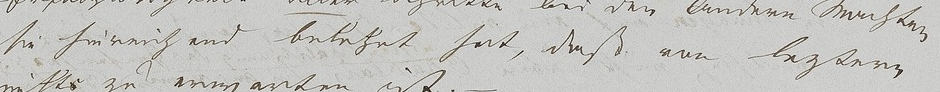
sie hinreichend belehrt hat, daß von leztern
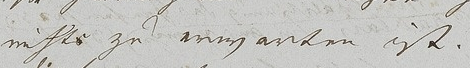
nichts zu erwarten ist. –
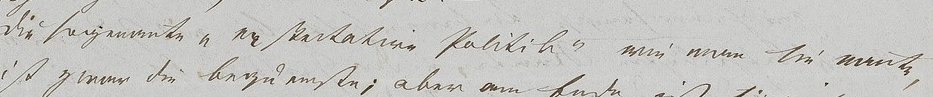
Die sogenannte «exspectative Politik» wie man sie nannte,
